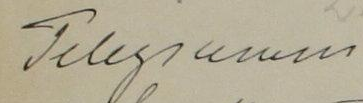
Telegramm
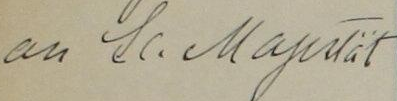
an Se. Majestät
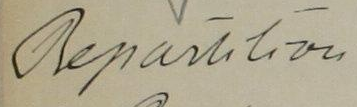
Repartition
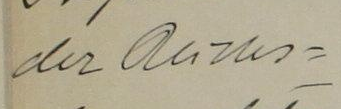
der Reichs-
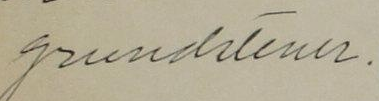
grundsteuer
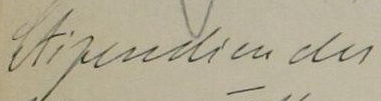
Stipendien der
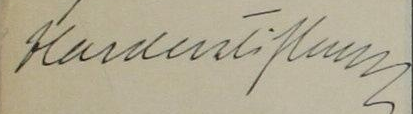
Harderstiftung
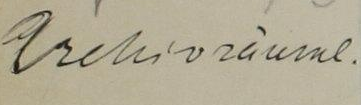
Archivräume
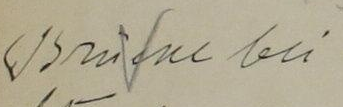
Brücke bei
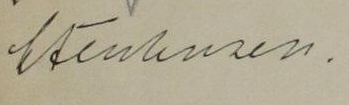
Stenhusen
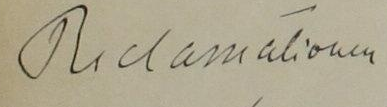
Reclamationen
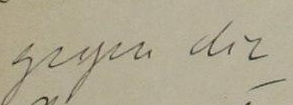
gegen die
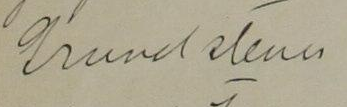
Grundsteuer
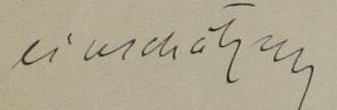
einschätzung
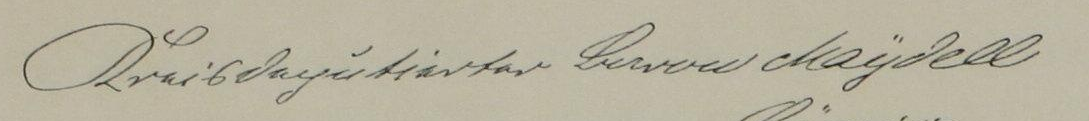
Kreisdeputierter Baron Maydell
